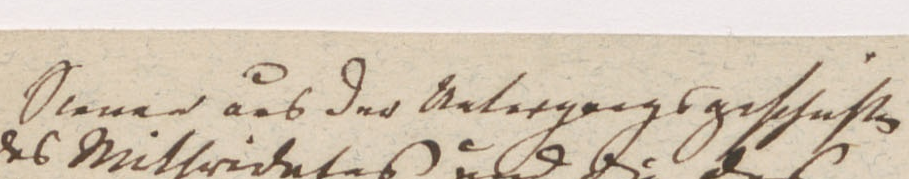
Scenen aus der Untergangsgeschichte
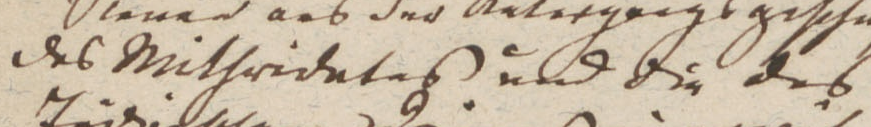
des Mithridates und die des
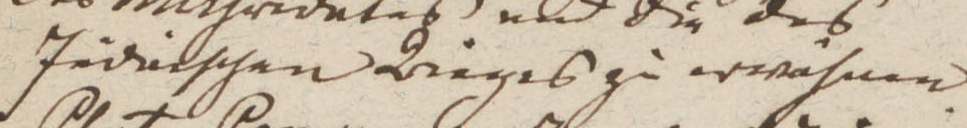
Jüdischen Krieges zu erwähnen
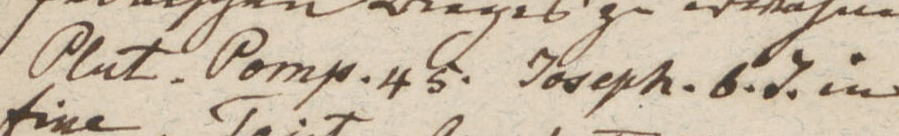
Plut. Pomp. 45. Joseph. b. J. in
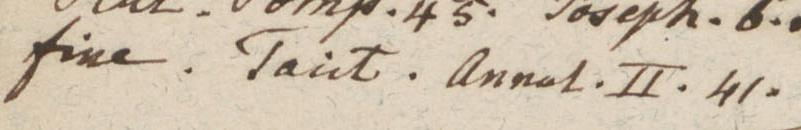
fine. Taict. Annal. II. 41.
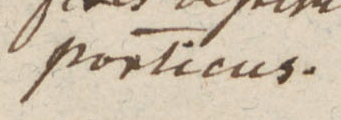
Dekorationen
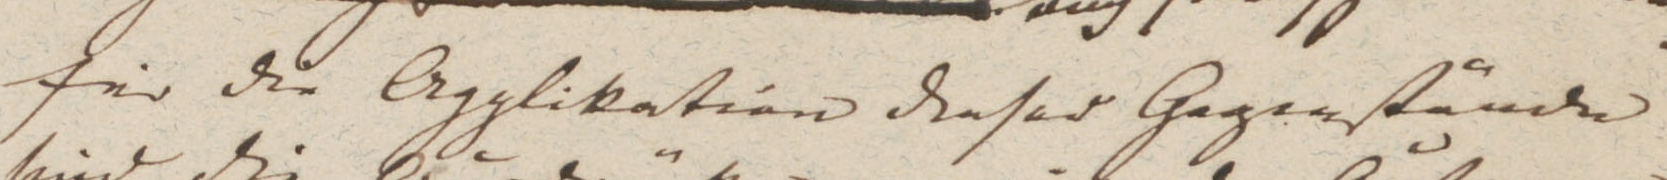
Für die Applikation dieser Gegenstände
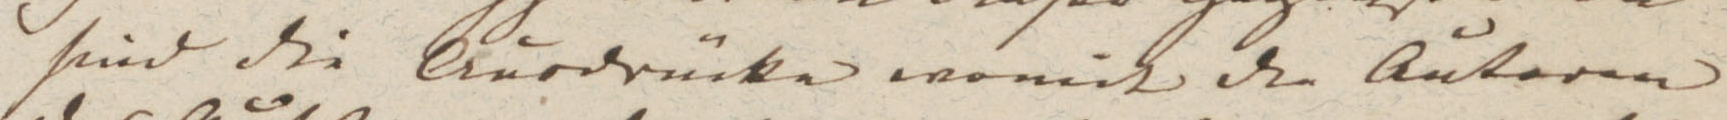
sind die Ausdrücke womit die Autoren
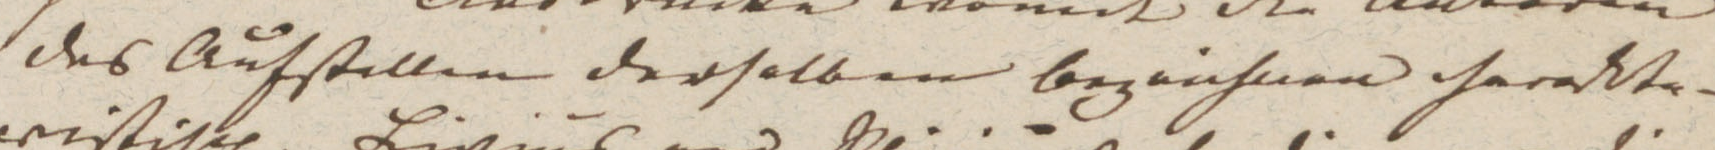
das Aufstellen derselben bezeichnen charakte-
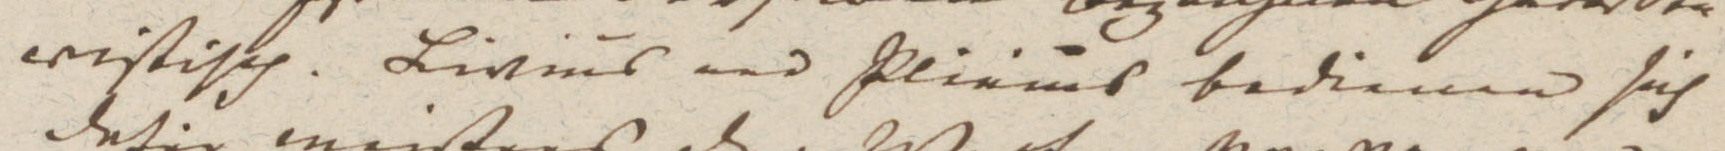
ristisch. Livius und Plinius bedienen sich
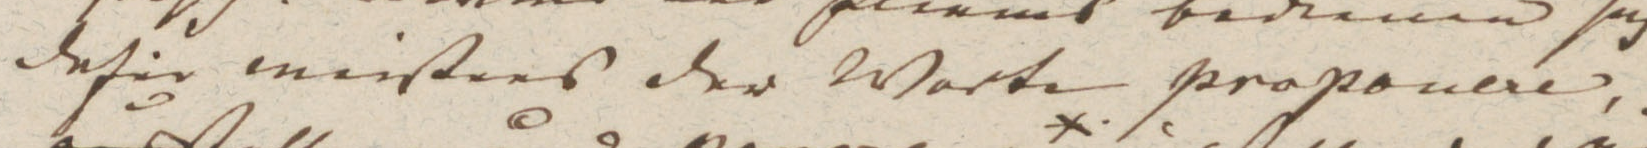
dafür meistens der Worte proponere,
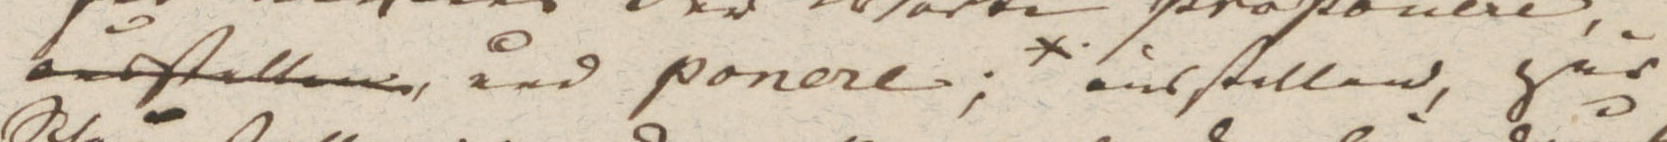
ausstellen, und ponere; % ausstellen, zur
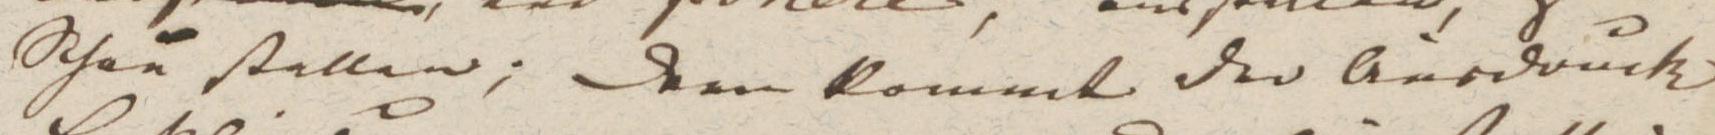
Schau stellen; Dann kommt der Ausdruck
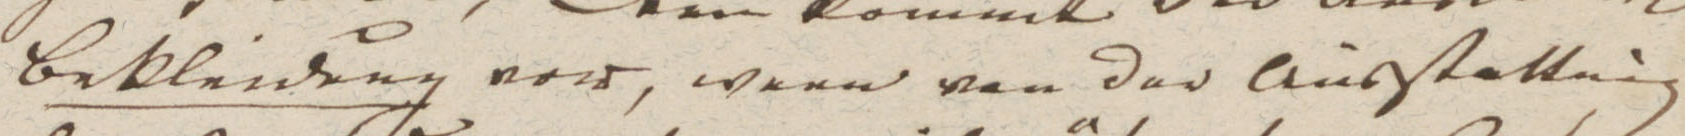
Bekleidung vor, wenn von der Ausstattung
